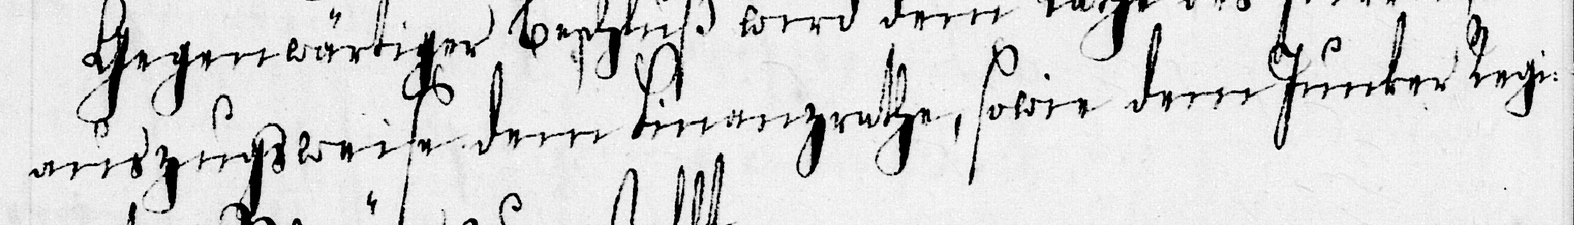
auszugsweise dem Finanzrathe, sowie dem Junker Regi¬
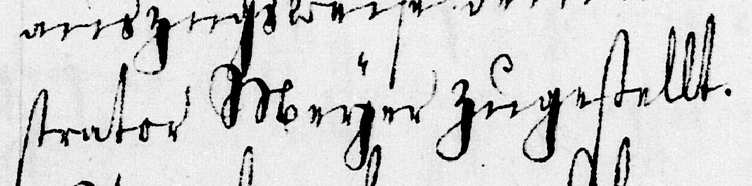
strator Meyer zugestellt.
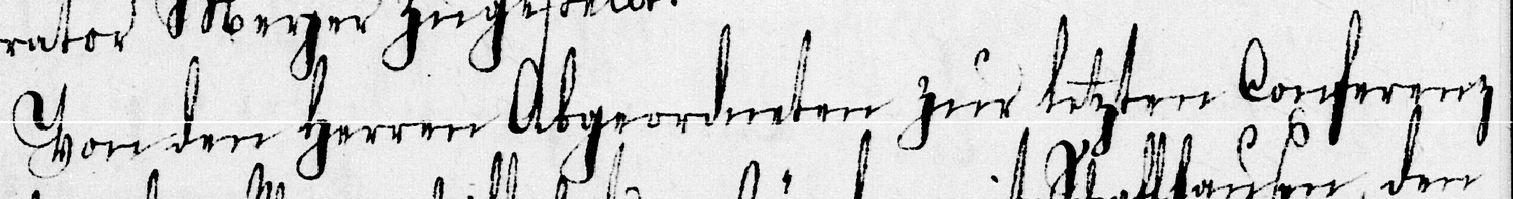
Von den Herren Abgeordneten zur letzten Conferenz
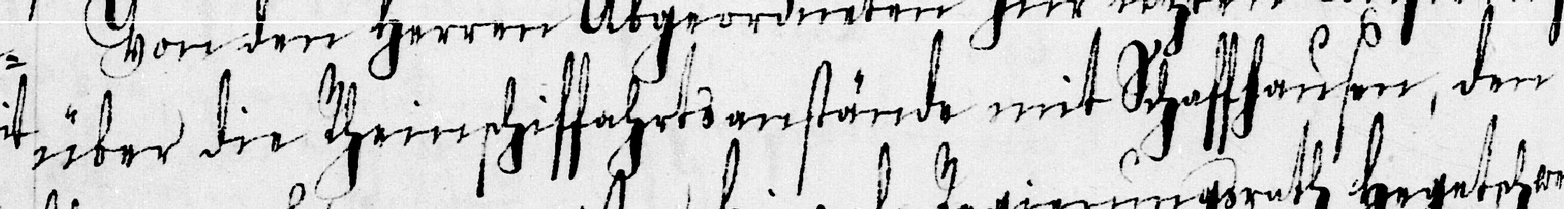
über die Rheinschiffahrtsanstände mit Schaffhausen, den
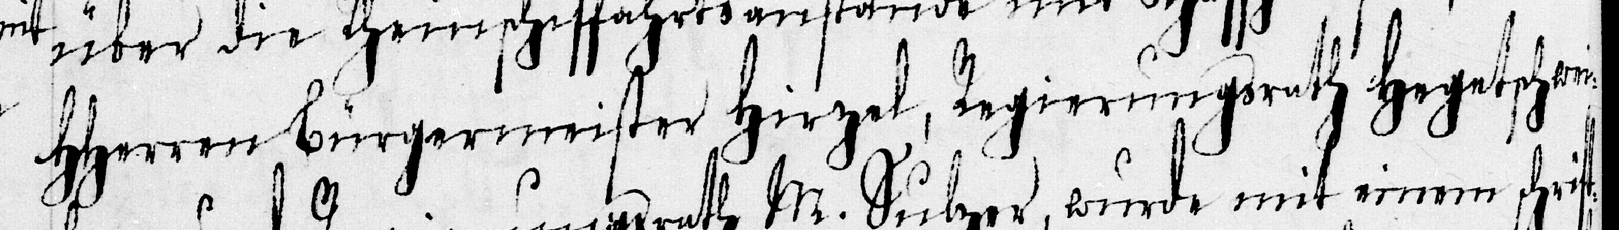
HHerren Bürgermeister Hirzel, Regierungsrath Hegetschwe¬
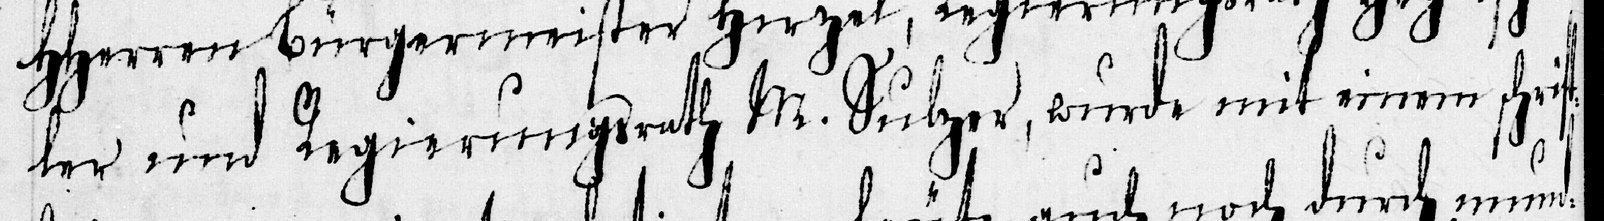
iler und Regierungsrath M. Sulzer, wurde mit einem schrif¬
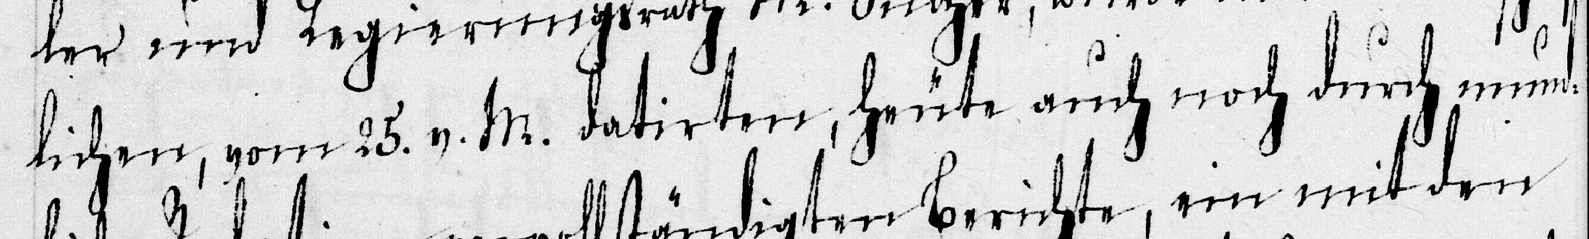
tlichen, vom 25. v. M. datirten, heute auch noch durch mund¬
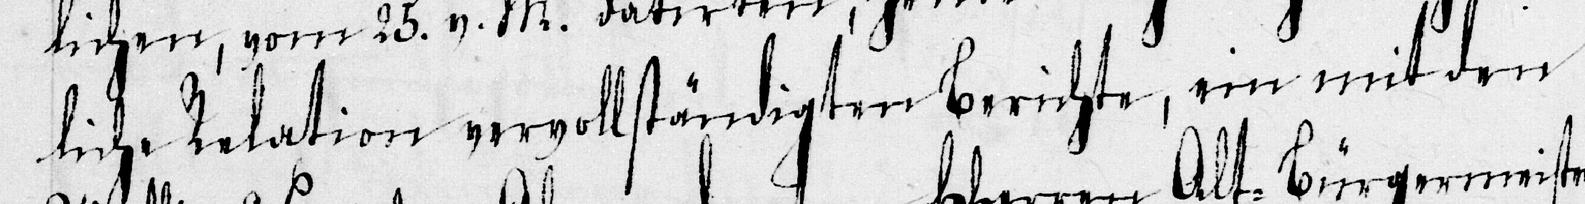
liche Relation vervollständigten Berichte, ein mit den
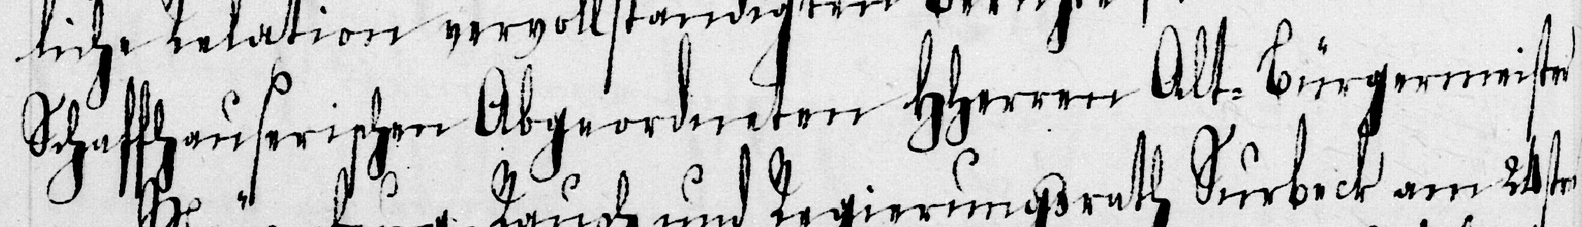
Schaffhauserischen Abgeordneten HHerren Alt-Bürgermeister
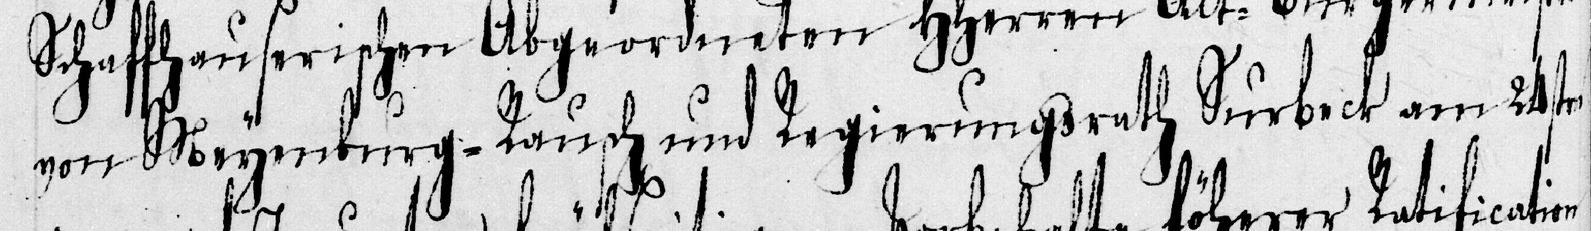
von Meyenburg-Rausch und Regierungsrath Surbeck am 24sten
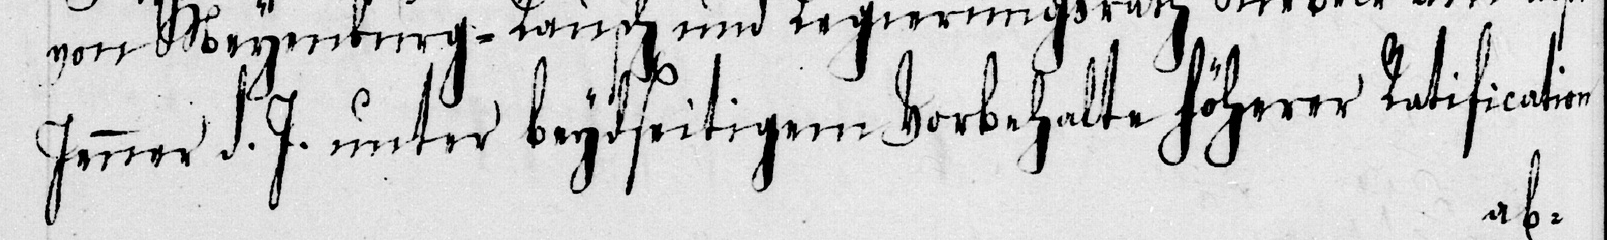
Jenner d. J. unter beydseitigem Vorbehalte höherer Ratificati¬
